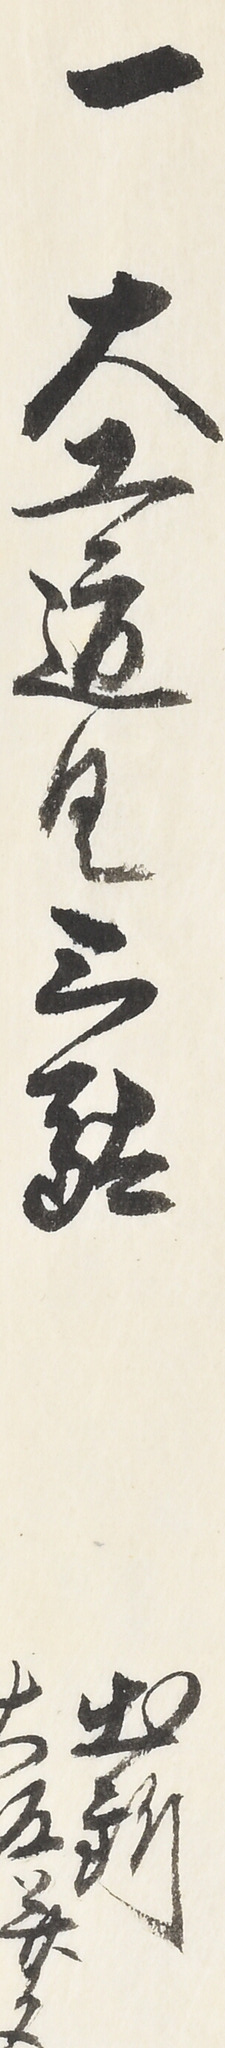一大工道具三駄出所
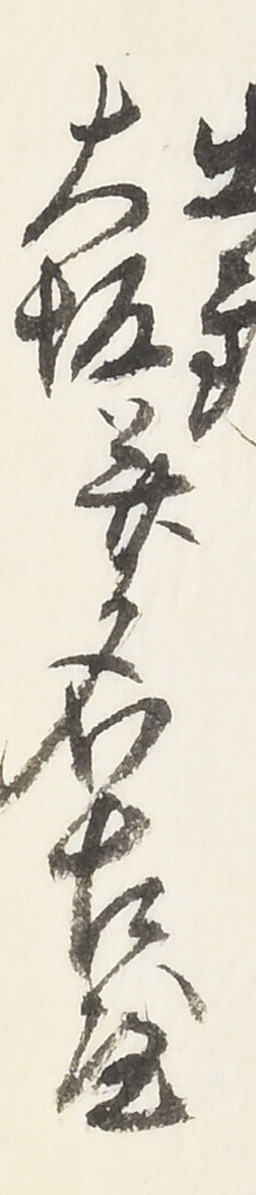大坂并名古屋
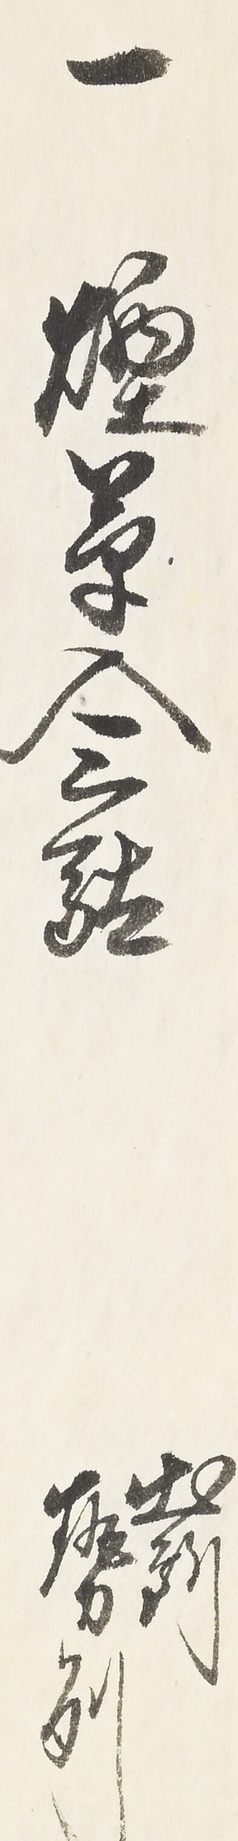一煙草入三駄出所
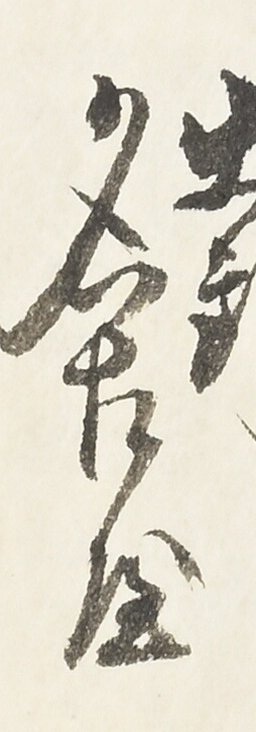名古屋
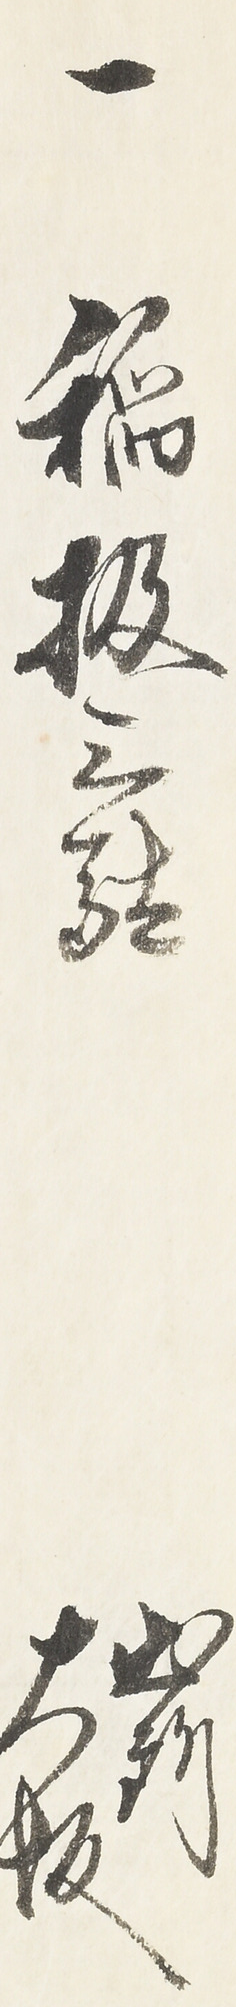一稲扱三駄出所
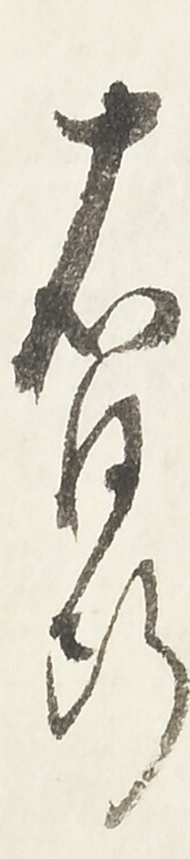右同断
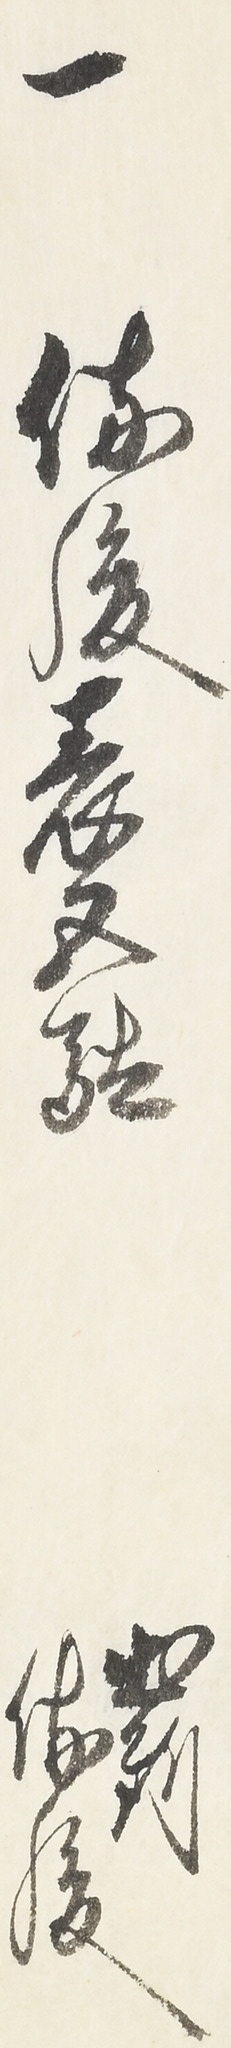一備後表五駄出所

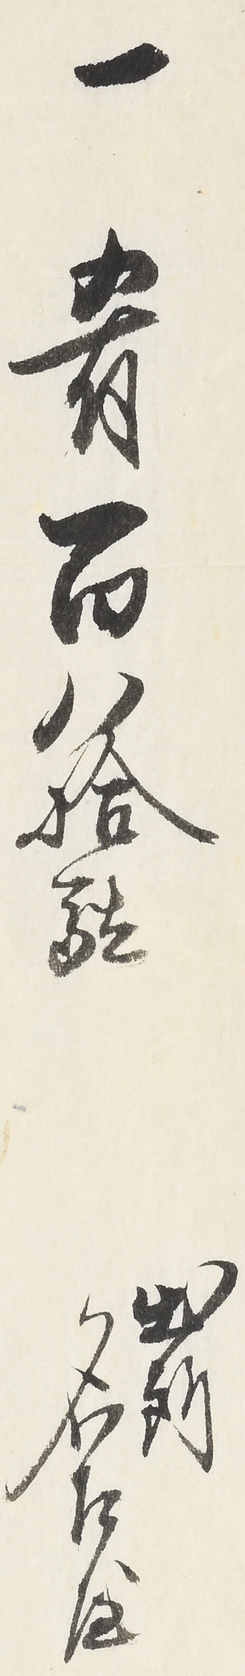一肴百八拾駄出所
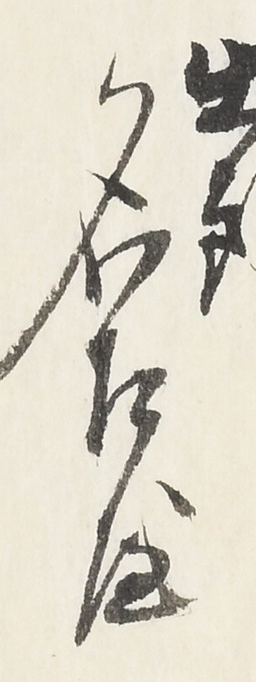名古屋
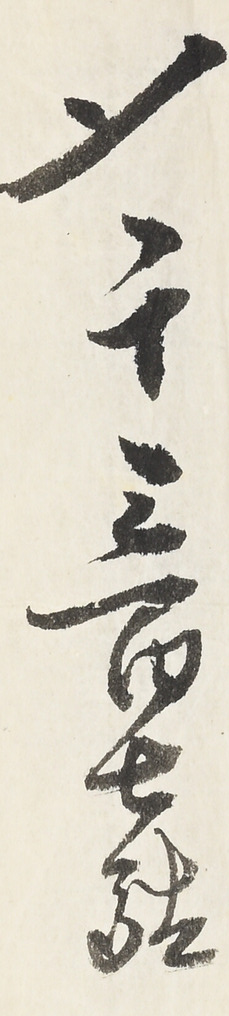〆千三百七駄
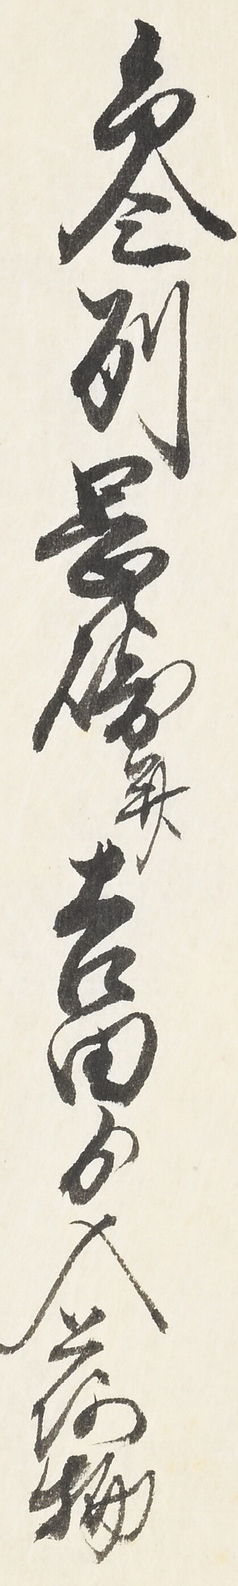参州岡崎并吉田ゟ入荷物
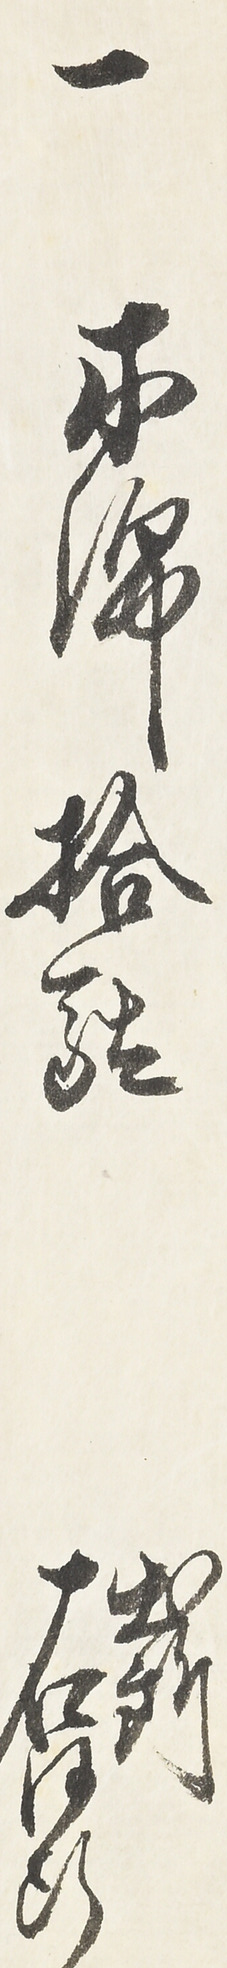一木綿拾駄出所
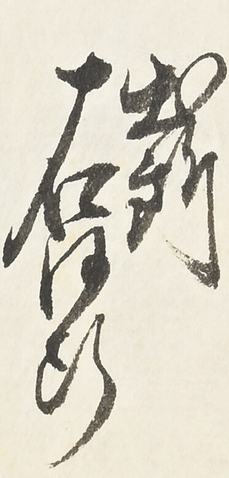右同断
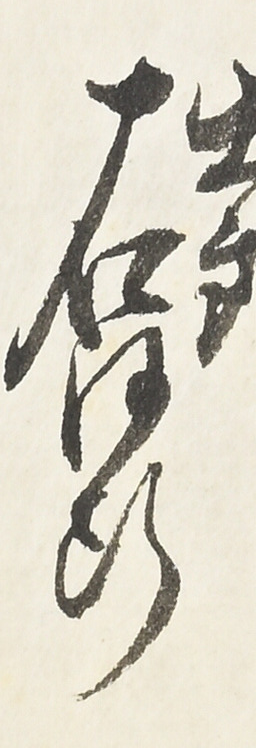右同断
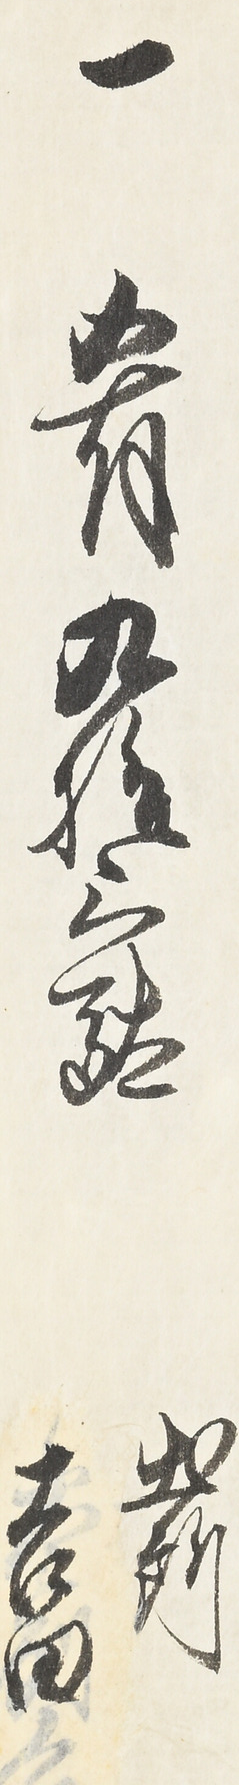一肴九拾三駄出所
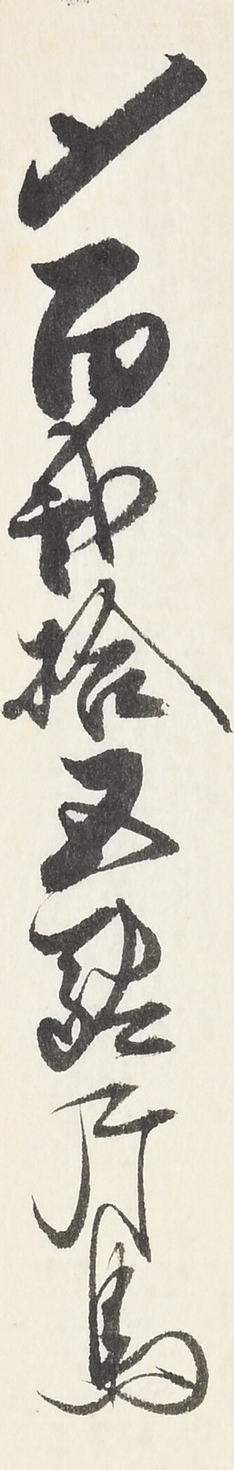〆百弐拾五駄片馬
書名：中馬ニテ附通候出入荷物目録帳
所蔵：伊那市立高遠町図書館・合同会社AMANE
